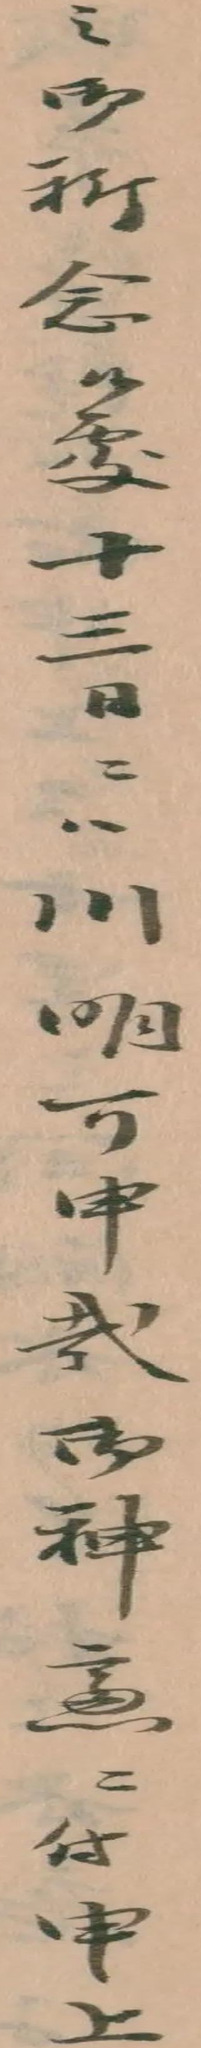御祈念候処十三日二ハ川明可申哉御神慮申上
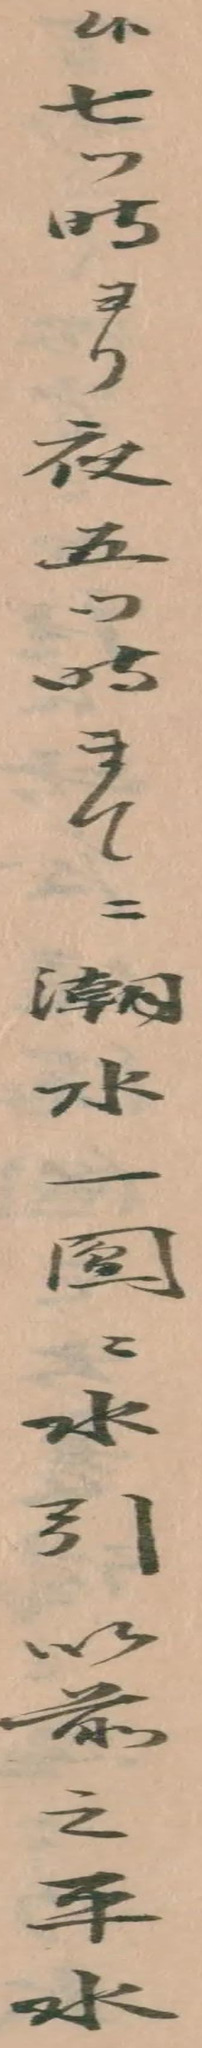候七ッ時より夜五ッ時まて二湖水一円二水引以前之平水
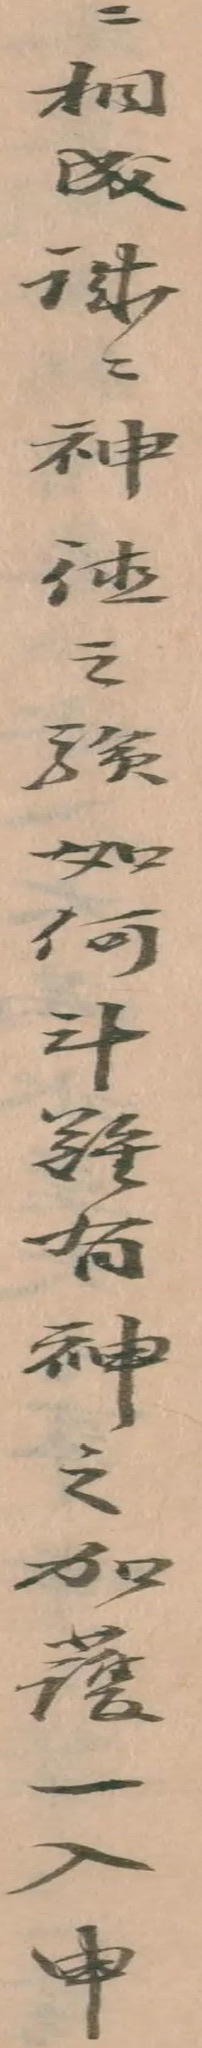二相成誠二神徳之験如何斗難有神之加護一入申
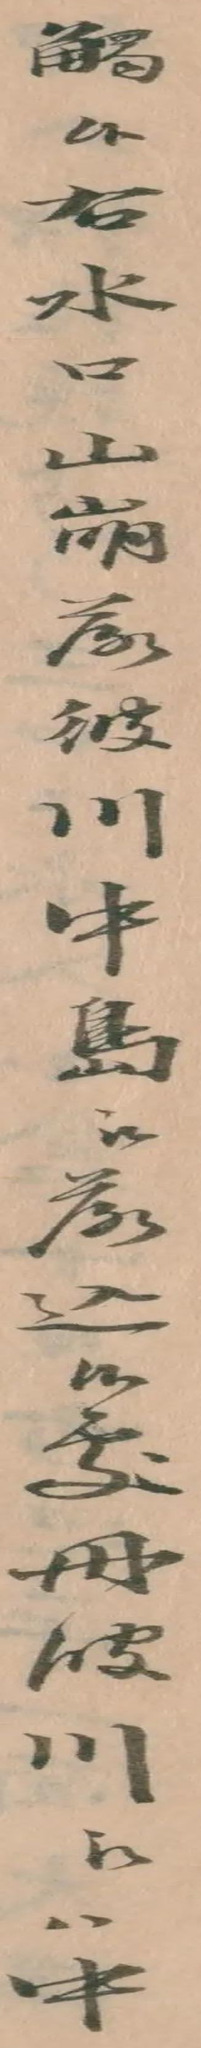触候右水口山崩落彼川中嶋へ落込候処丹波川江ハ中
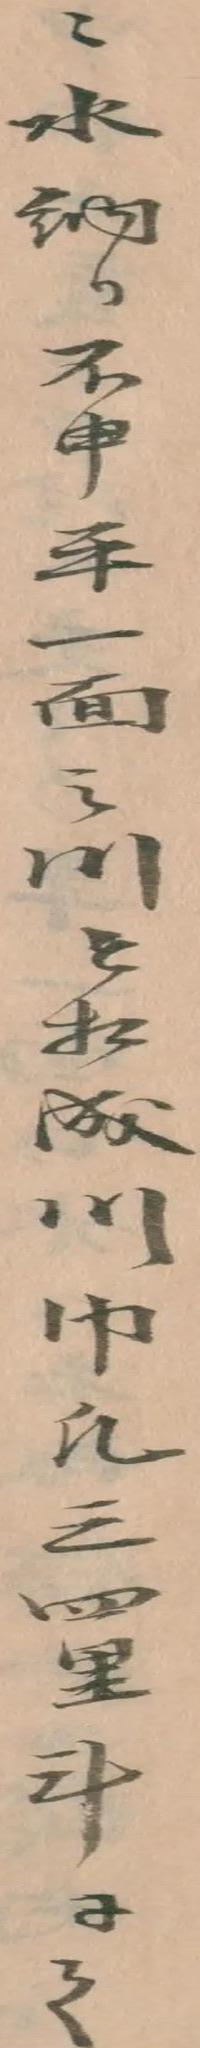々水納り不申平一面之川と相成川巾凡三四里斗にて
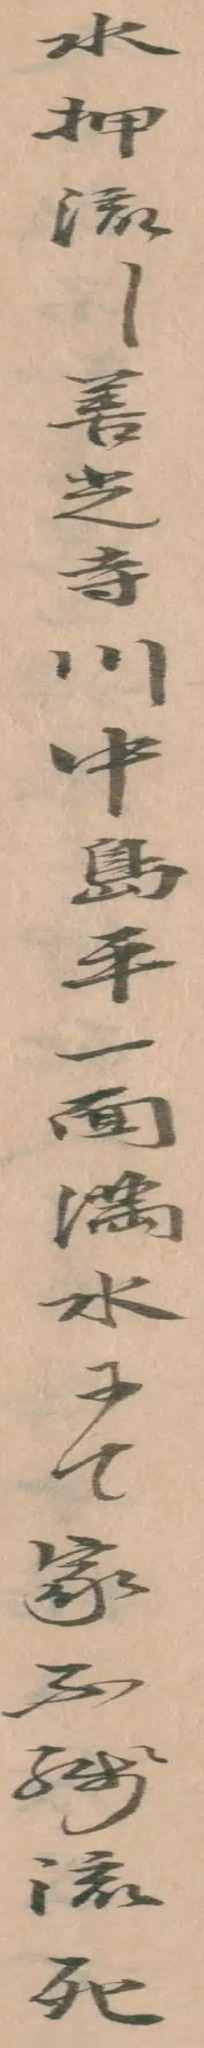水押流し善光寺川中嶋平一面満水にて家不残流死

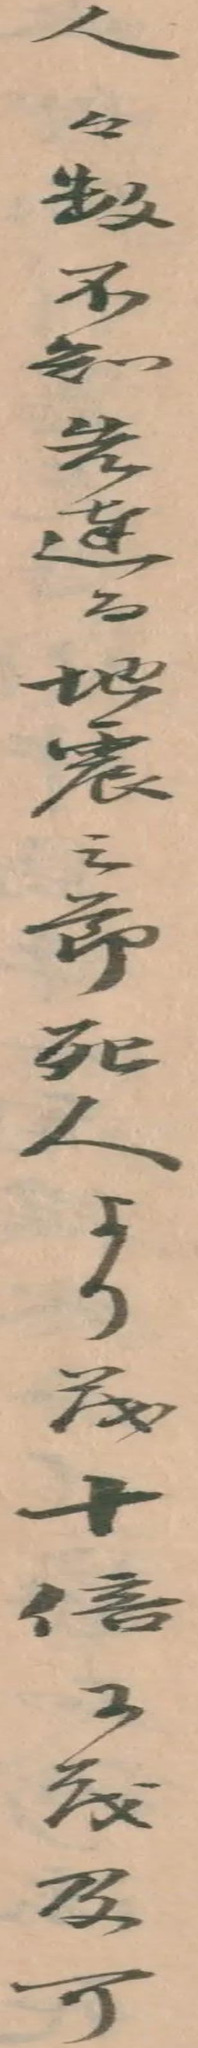人之数不知先達而地震之節之死人よりも十倍二も及可
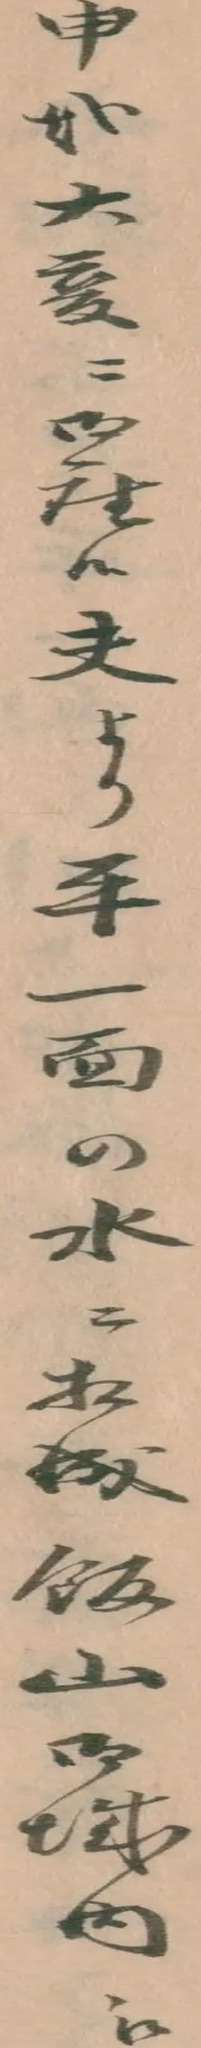申哉大変二御座候夫より平一面水二相成飯山御城内江
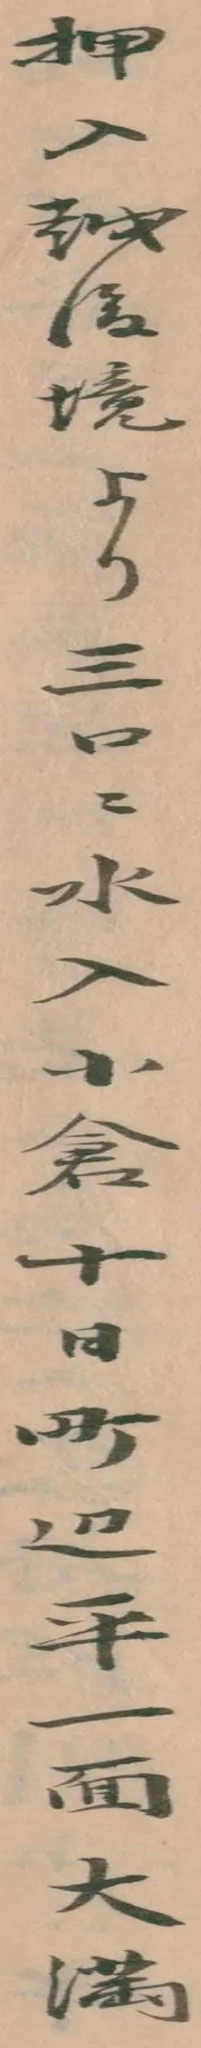押入越後境より三口二水入小倉十日町辺平一面大満
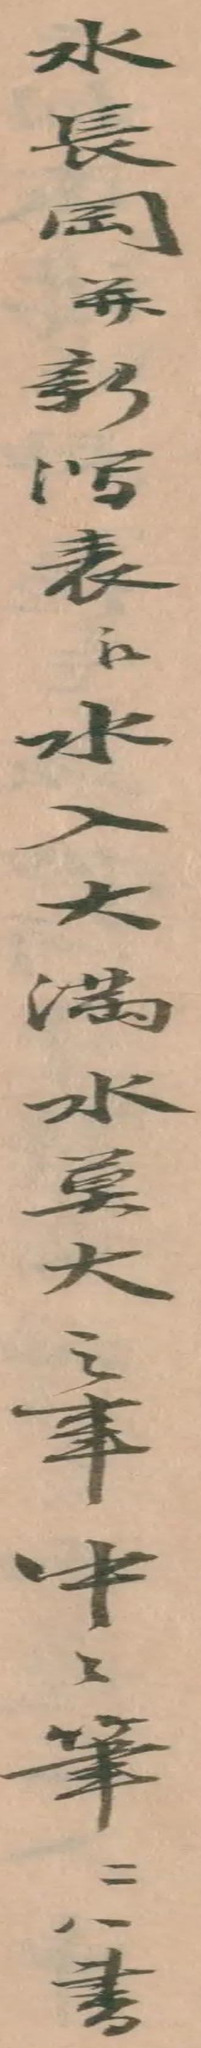水長岡并新潟表江水入大満水莫大之事中々筆二ハ書
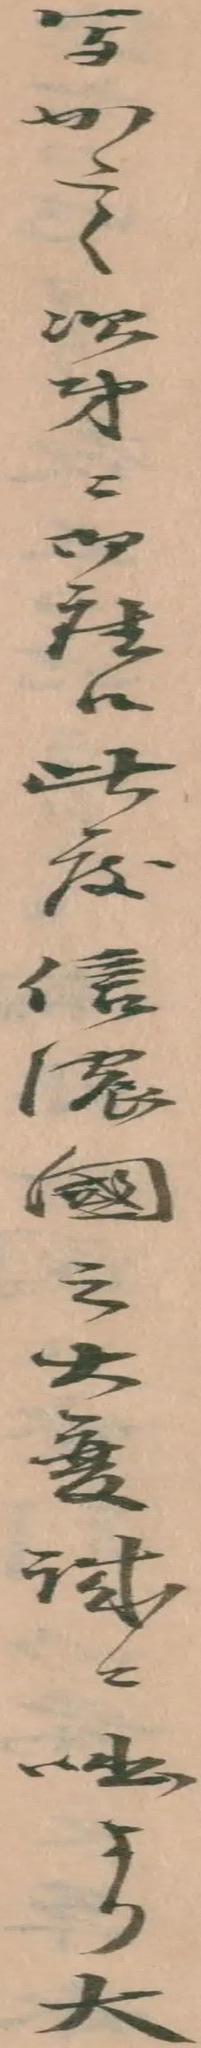写かたく次第二御座候此度信濃国之大変誠二咄より大
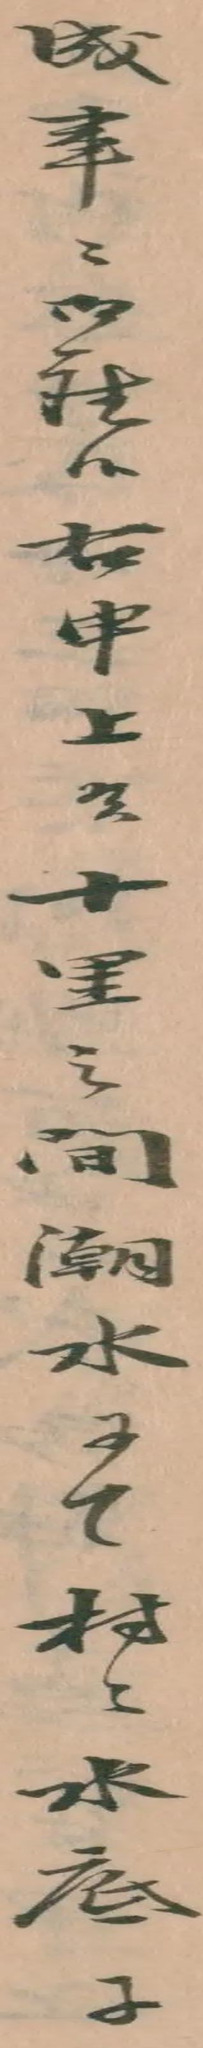成事二御座候右申上候十里之間湖水にて村々水底に
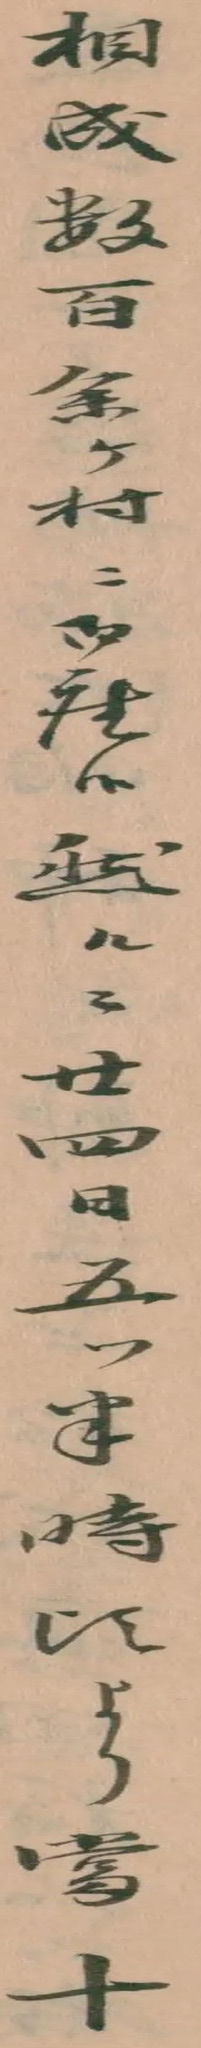相成数百余ヶ村二御座候然ㇽ二廿四日五ッ半時頃より当十
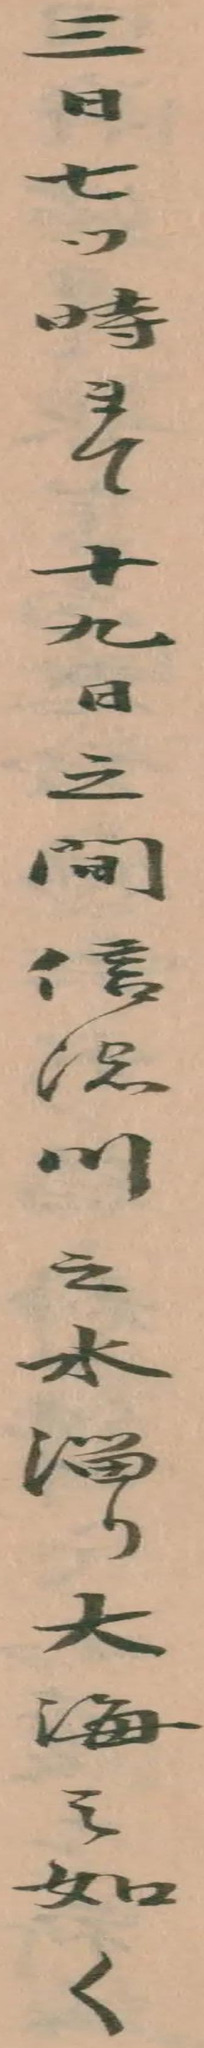三日七ッ時まて十九日之間信濃川之水溜り大海之如く
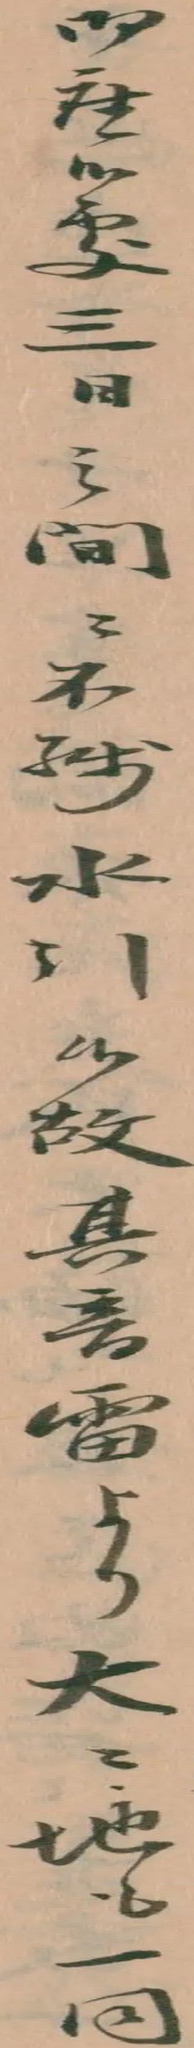御座候処三日の間二不残水引候故其音雷ゟ大二天地も一同
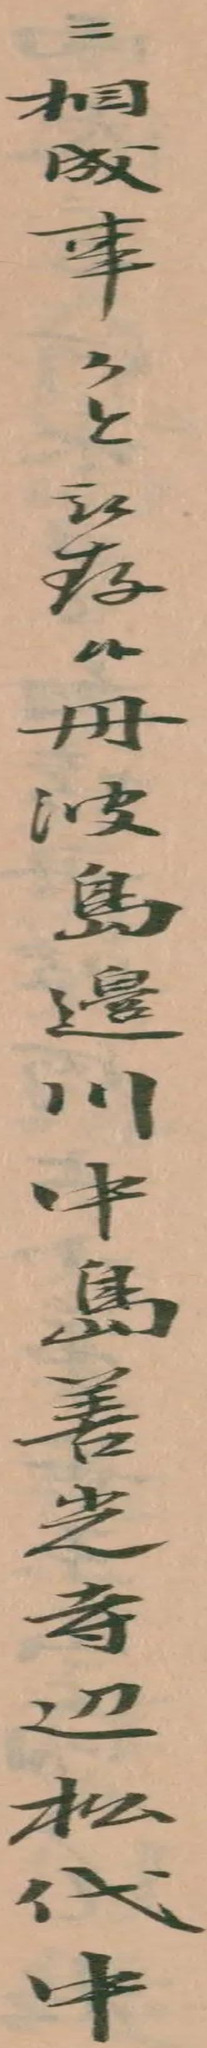二相成事かと被存候丹波嶋辺川中嶋善光寺辺松代中
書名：地災撮要. 巻3(地震之部)-巻4(噴火之部)
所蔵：国立国会図書館 National Diet Library, JAPAN
